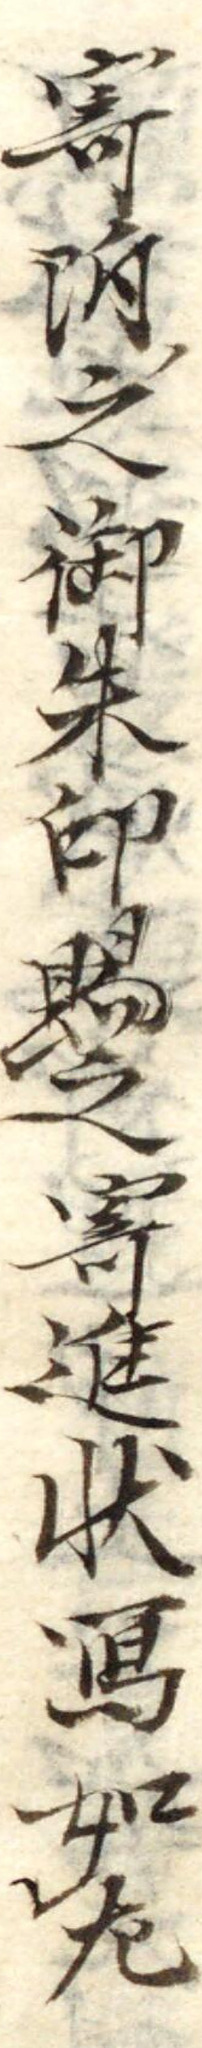寄附之御朱印賜之寄進状写如左
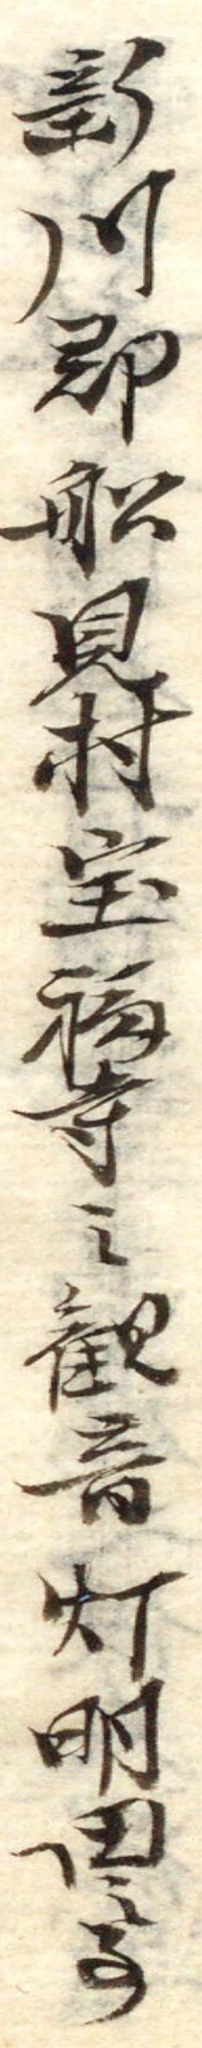新川郡舩見村宝福寺之観音灯明田之事
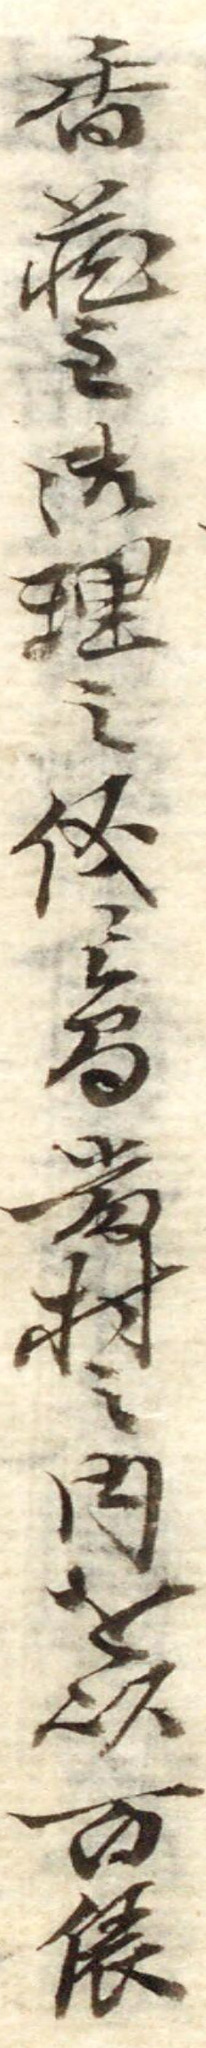香蔵主御理之儀に候間当村之内を以百俵
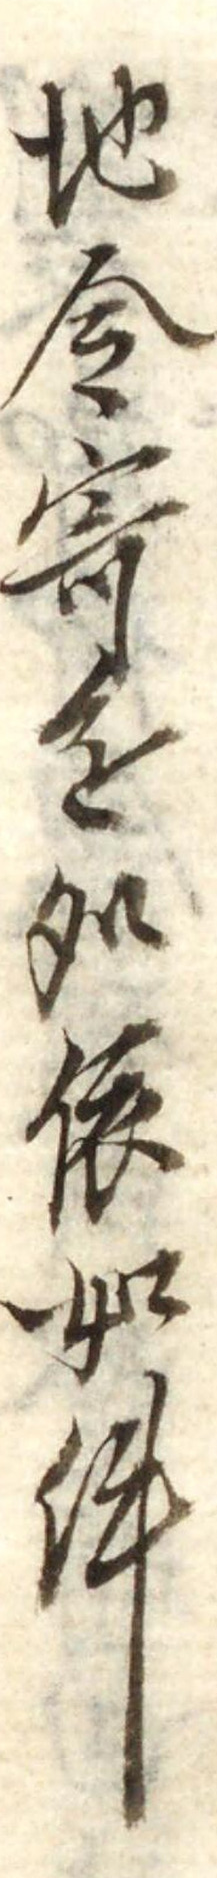地令寄進処依如件
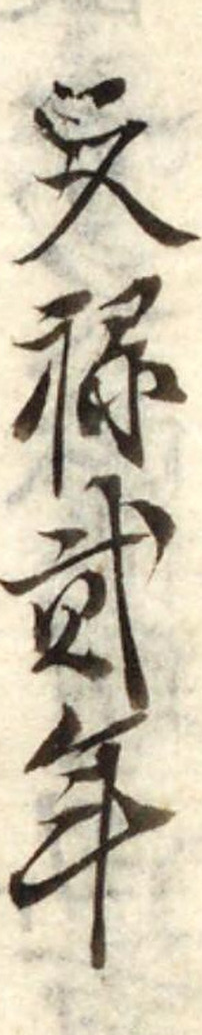文禄貳年
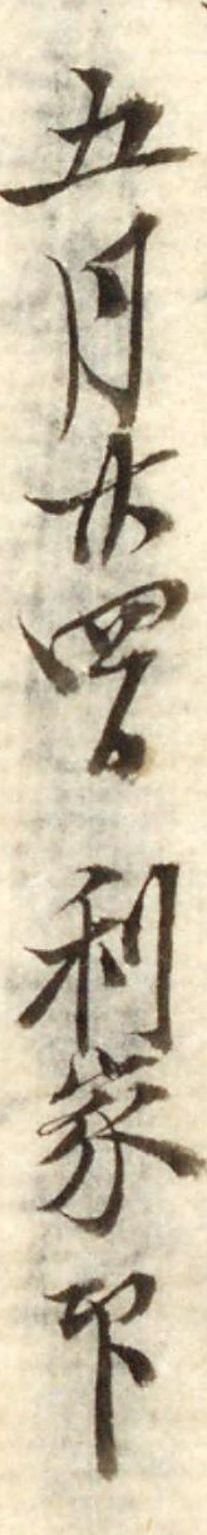五年廿四日利家印
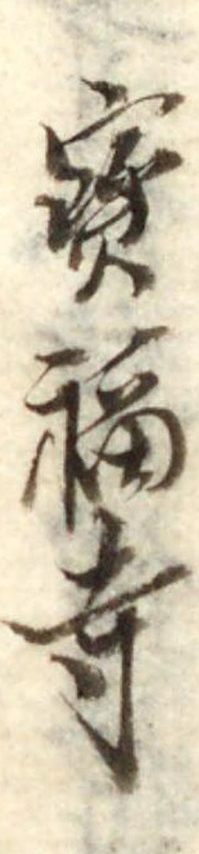宝福寺
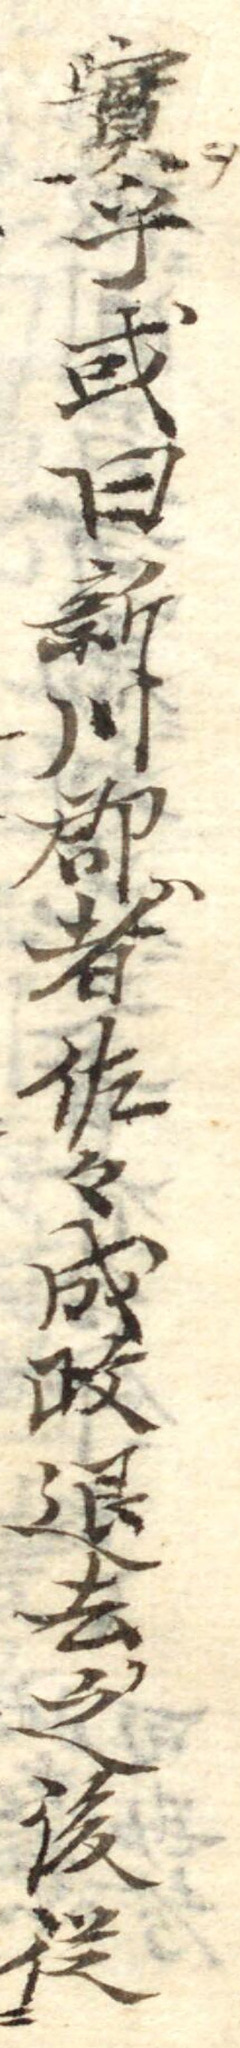實を乎或曰新川郡者佐々成政退去之後従
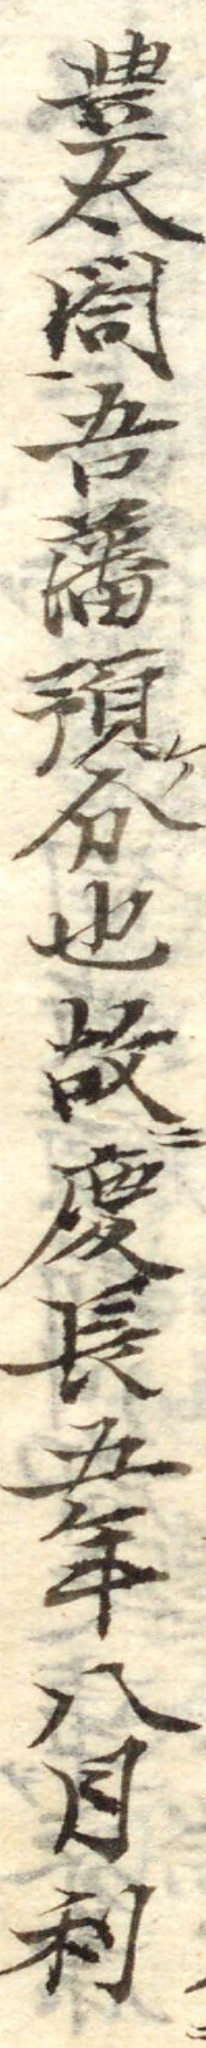豊太閤吾藩預け分也故に慶長五年八月利
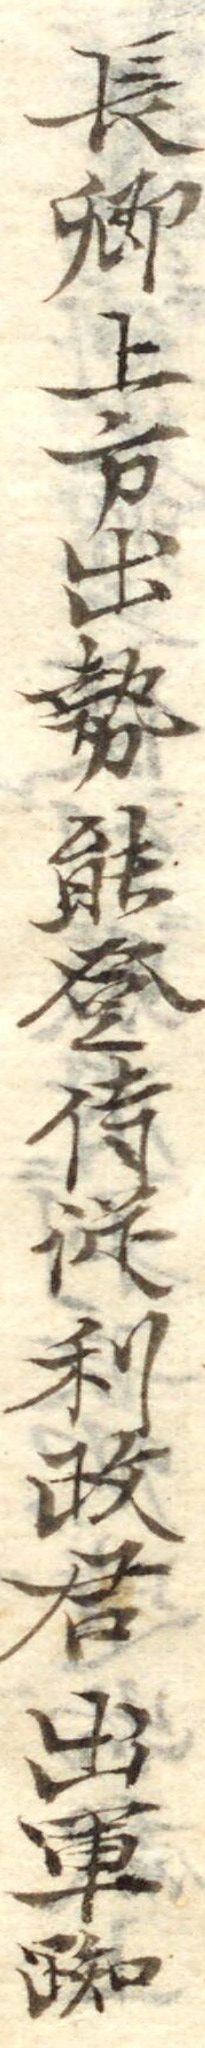長卿上方出勢能登侍従利政君出軍踟
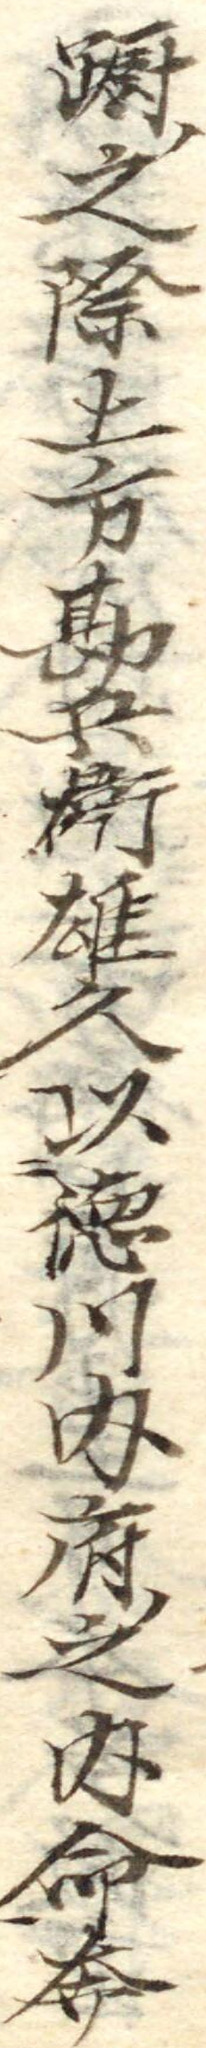蟵之際土方勘兵衛雄久以德川内府之内命奔
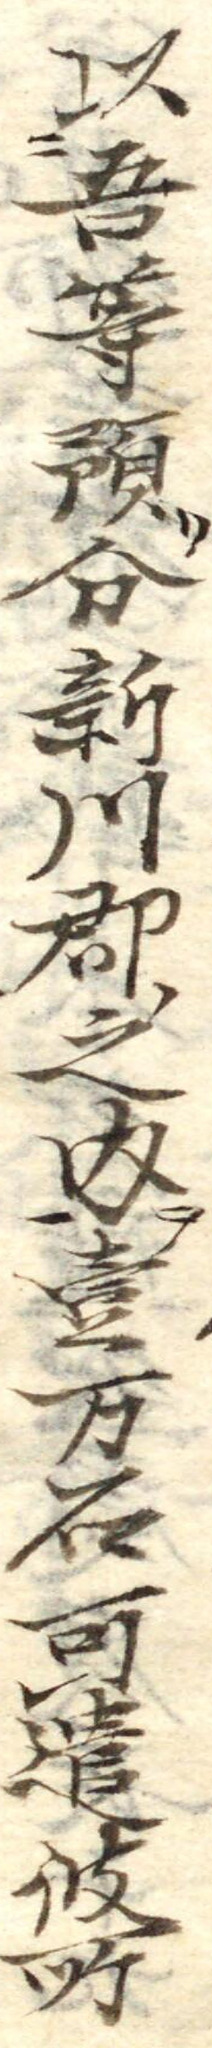以吾等預り分新川郡之内を壹万石可遣彼所
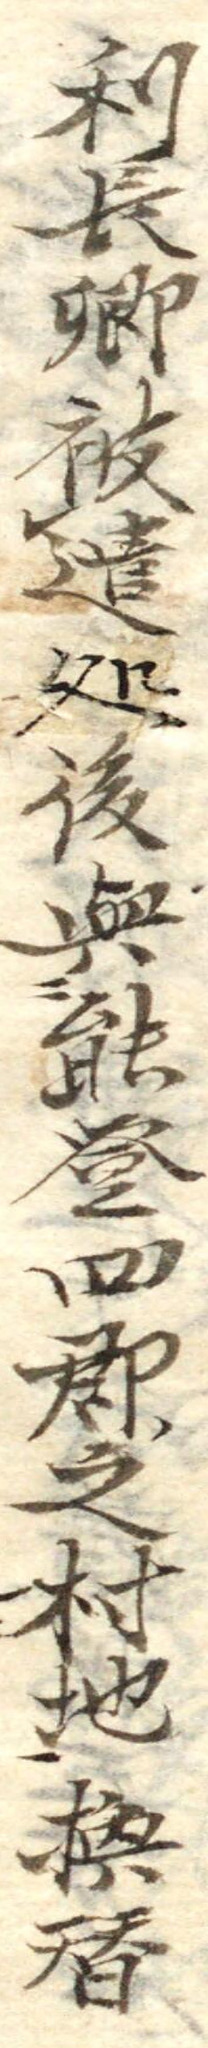利長卿被遣処後與能登四郡之村也換替
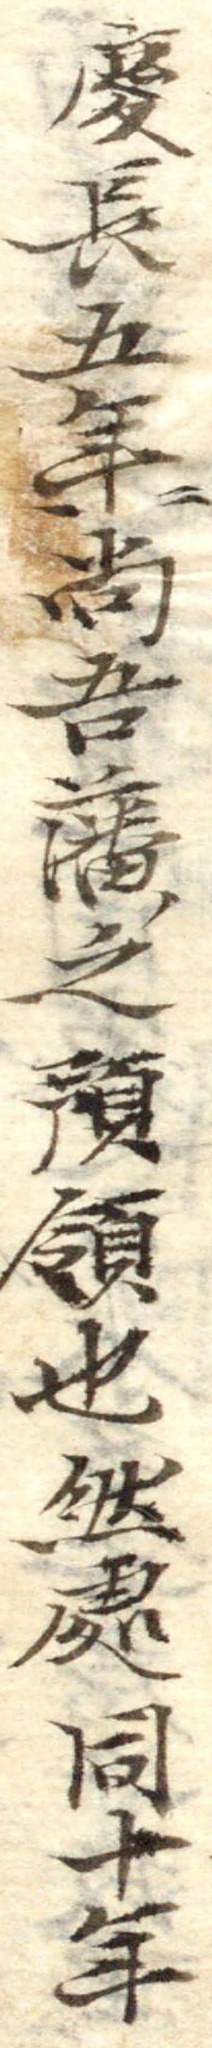慶長五年に尚吾藩之預領也然處同十年
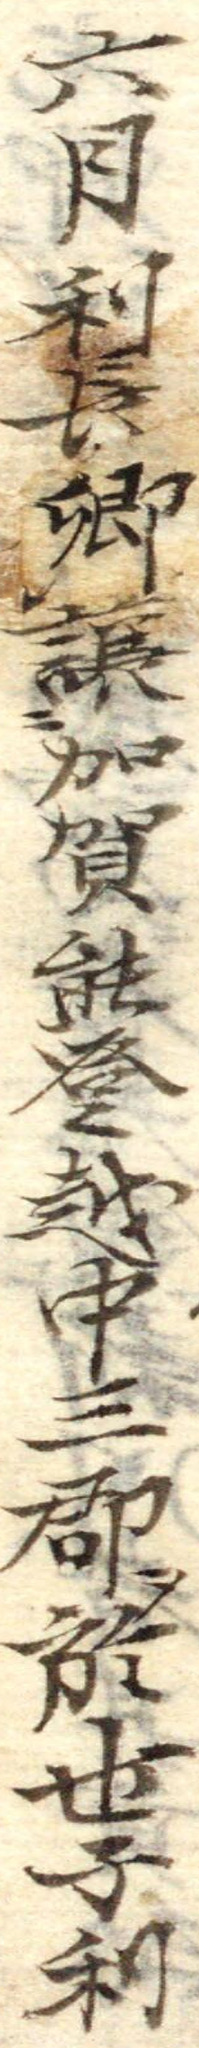六月利長卿譲加賀能登越中三郡於世子利

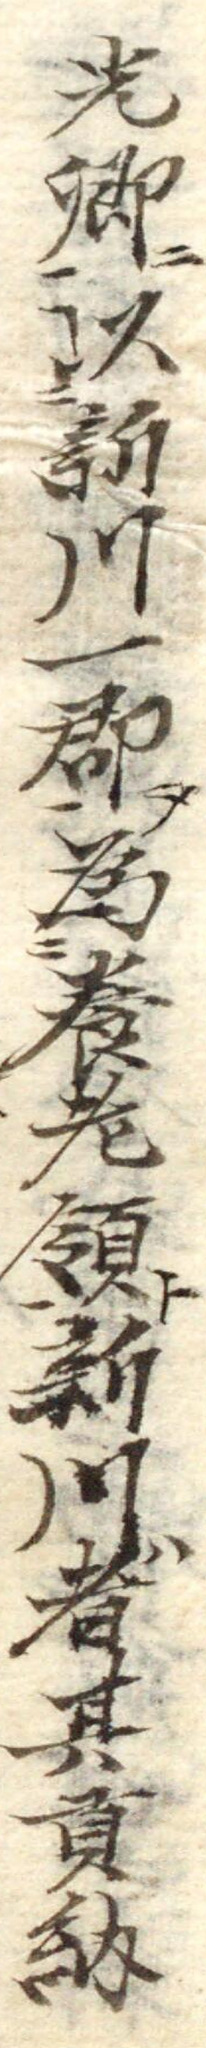光卿に以新川一郡を為養老領と新川者其貢納
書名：前田家封国証書集録
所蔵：Ishikawa Prefectural Library
